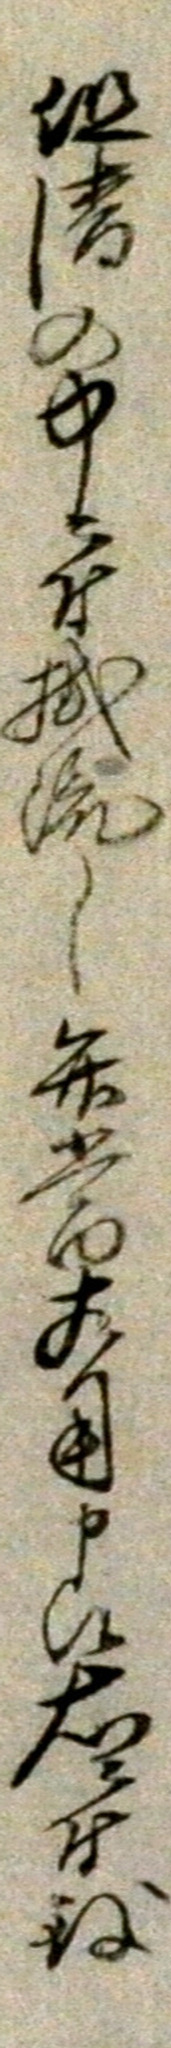但清の中ニ付掛流し弁当相用申候右ニ付致
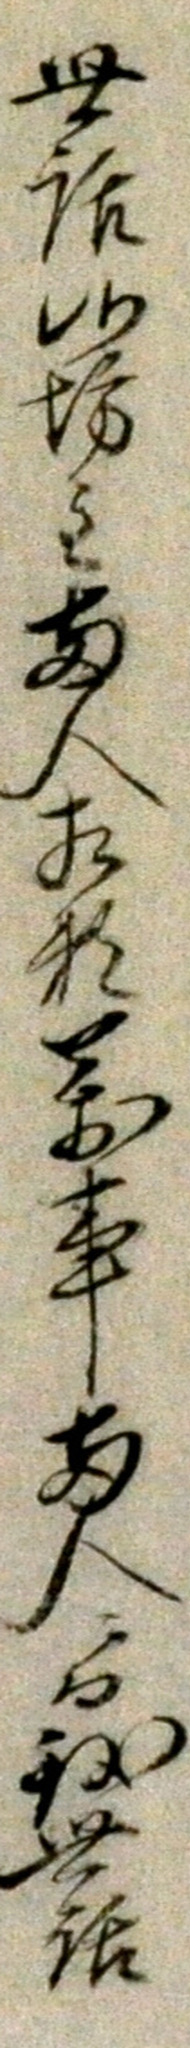世話候坊主両人相頼万事両人ニ而致世話
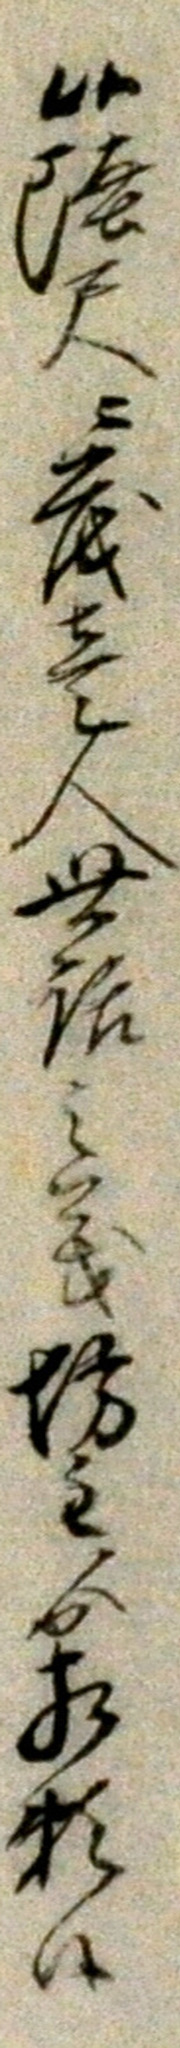候陸尺にも壱人世話之義坊主ゟ相頼候
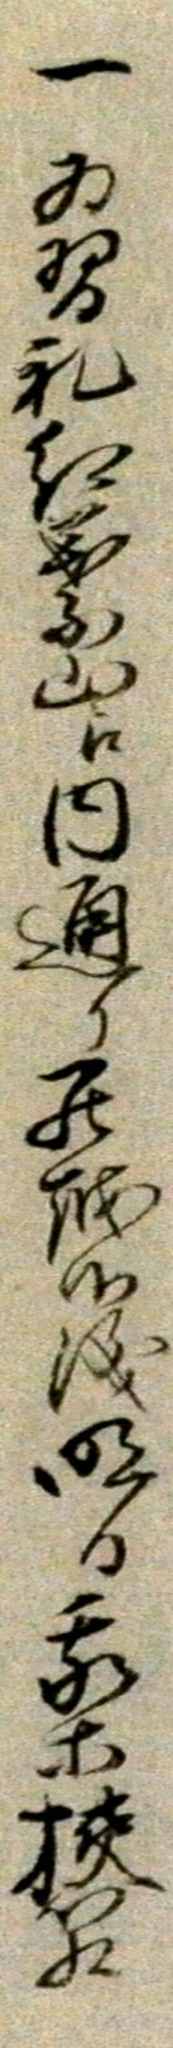一為習礼紅葉山え内通り罷越候儀明日我等挟箱
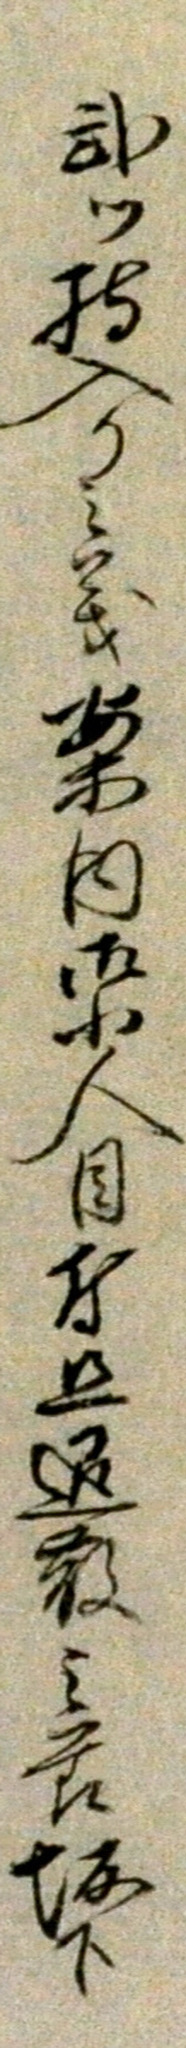弐ツ持入り之義案内御小人目付且退散之節坂下
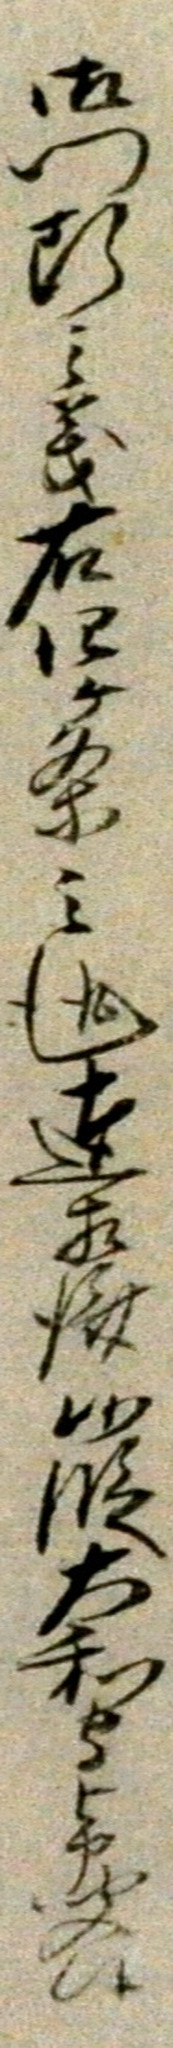御門断之義右四ヶ条之趣達相済候段大和被申聞候
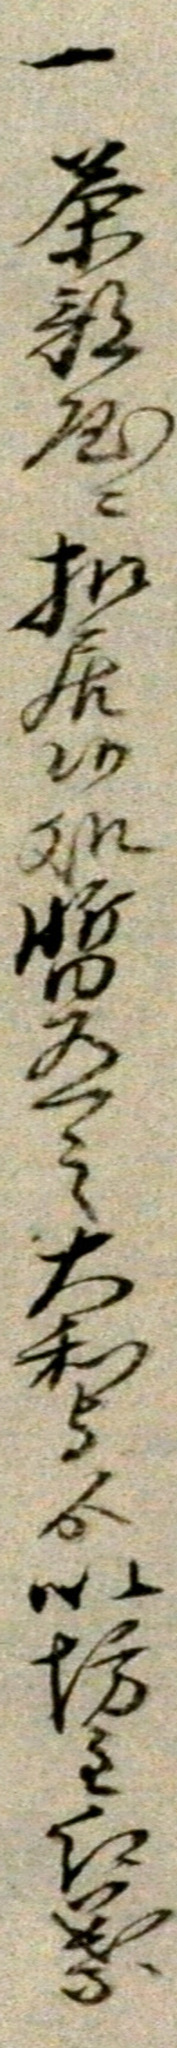一茶部屋ニ扣居候処暫有之大和守ゟ以坊主紅葉
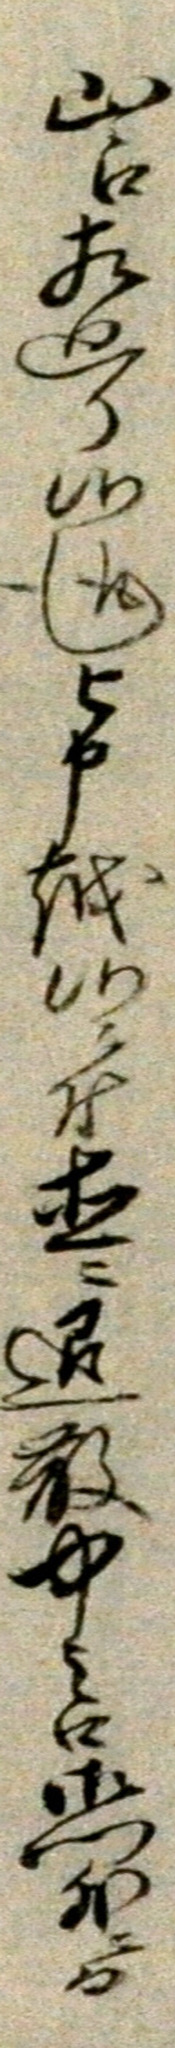山え相廻り候趣被申越候ニ付直ニ退散中之口御門外ニ而
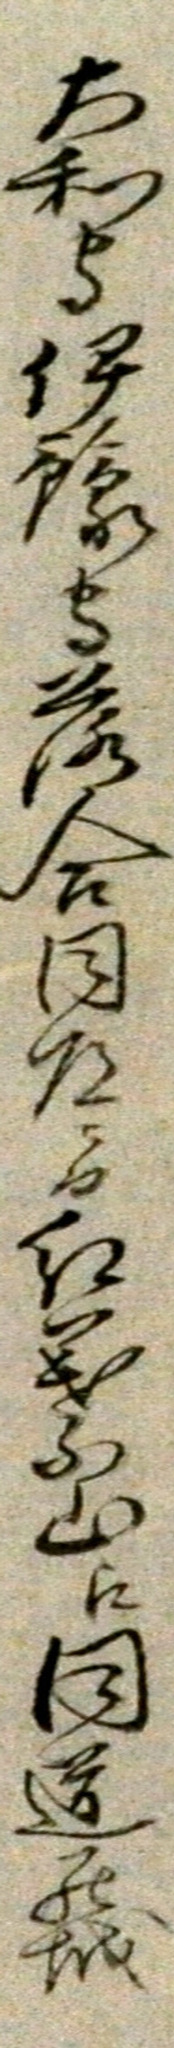大和守伊豫守落合同道ニ而紅葉山え同道罷越
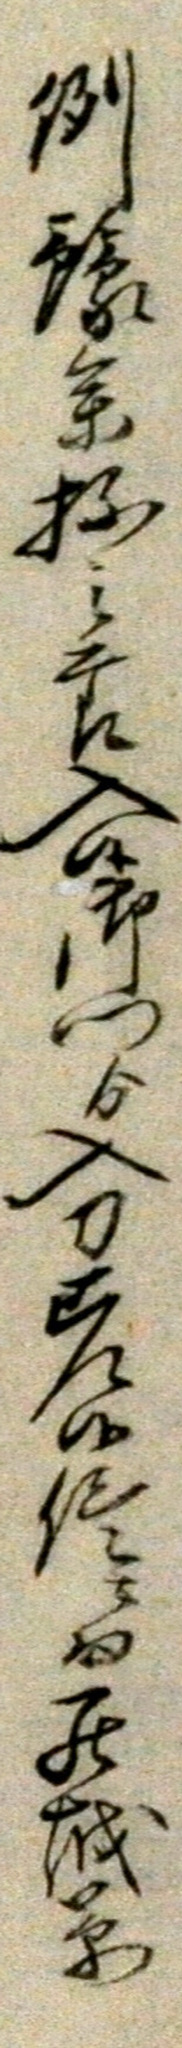例予参抔之節入候御門ゟ入刀差候侭ニ而罷越草
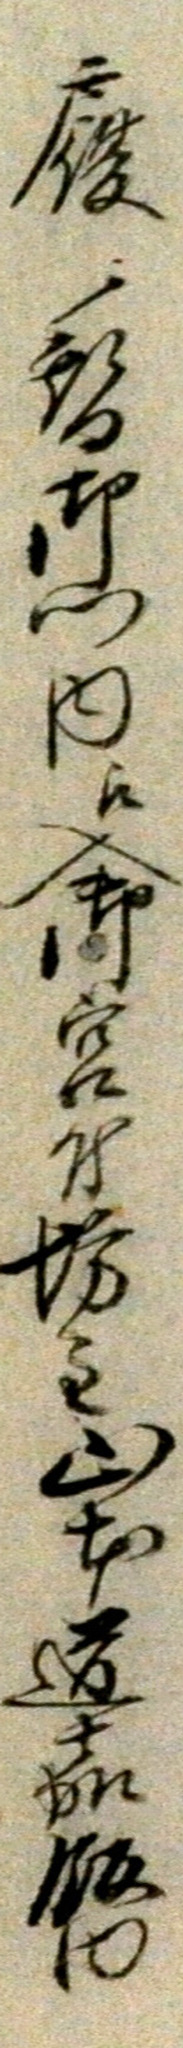履ニ替御門内え入御宮付坊主山本道嘉飯田
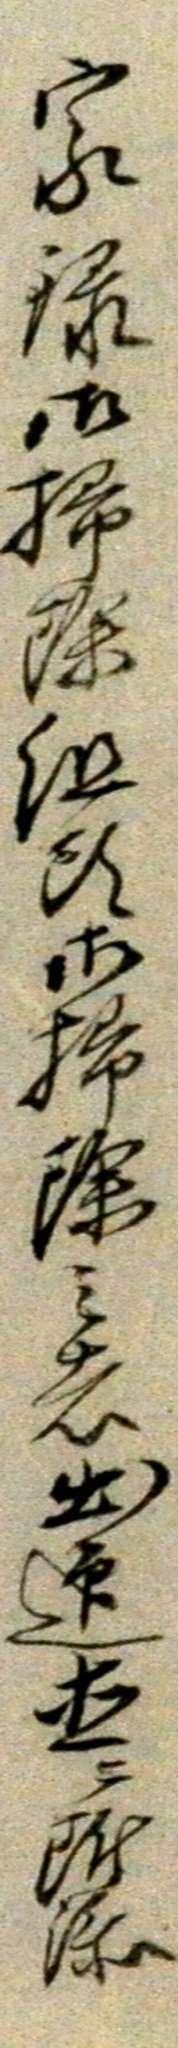宗録御掃除組頭御掃除之者出迎直ニ附添
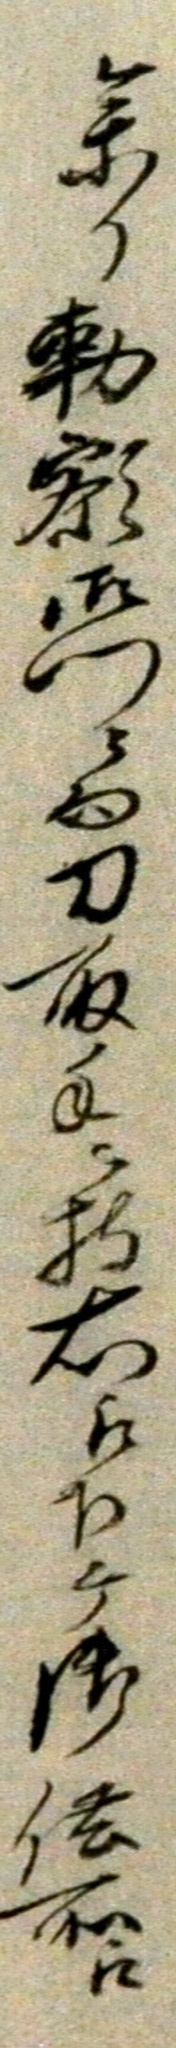参り勅願御門ニ而刀取手ニ持右え下ケ御供所え
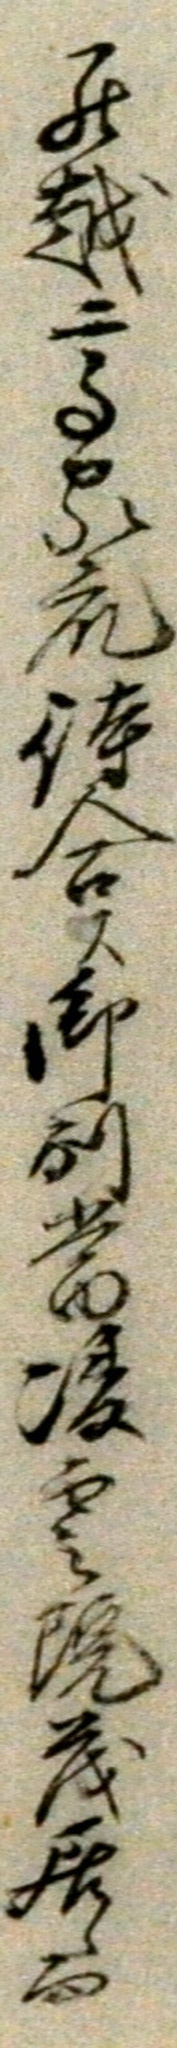罷越高家衆待合ス御別当凌雲院も居候而
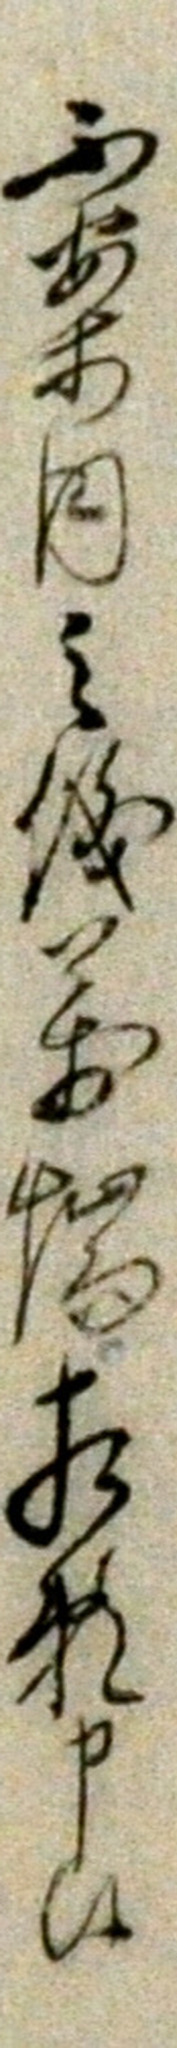不案内之儀万端相頼申候

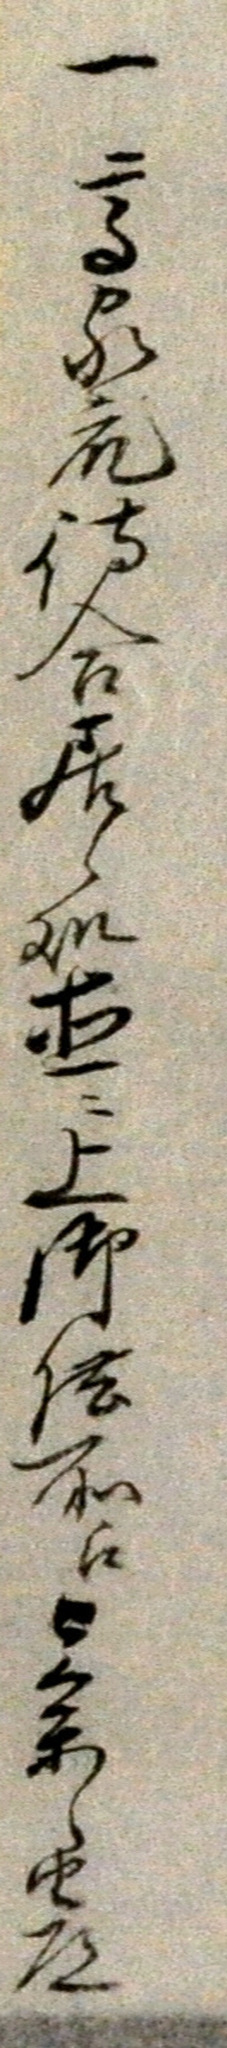一高家衆待合居候処直ニ上御供所え被参候由道
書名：御鏡餅御用留（写）
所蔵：伊那市立高遠町図書館・合同会社AMANE
